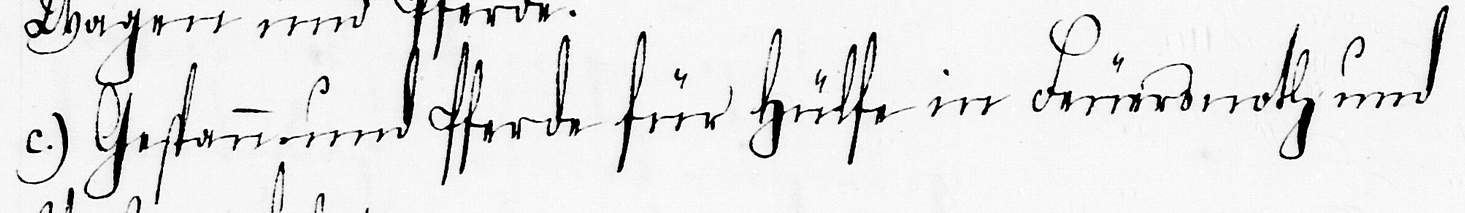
c.) Gespann und Pferde für Hülfe in Feuersnoth und
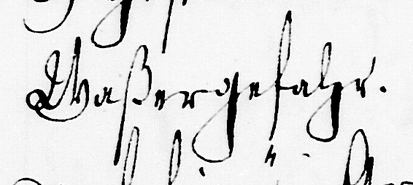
Waßergefahr.
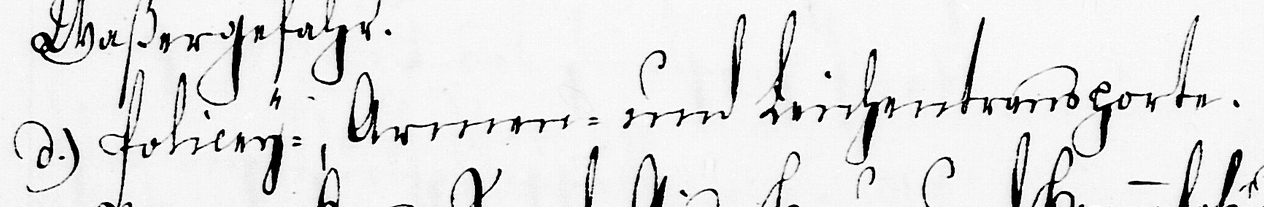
d.) Policey-, Armen- und Leichentransporte.
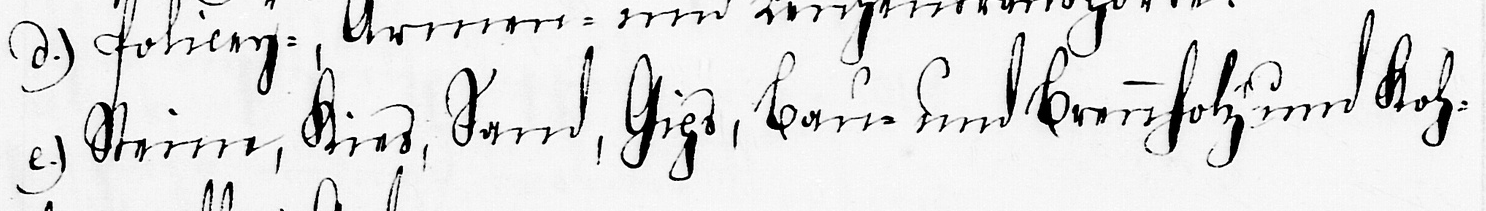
e.) Steine, Kies, Sand, Gips, Bau- und Brennholz und Koh¬
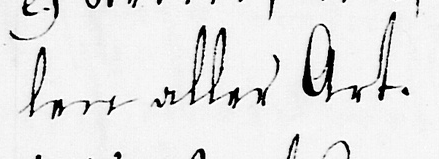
len aller Art.
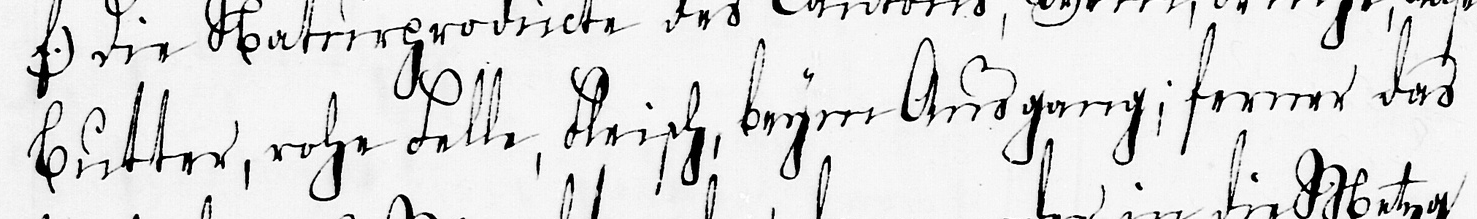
Butter, rohe Felle, Fleisch, beym Ausgang; ferner das
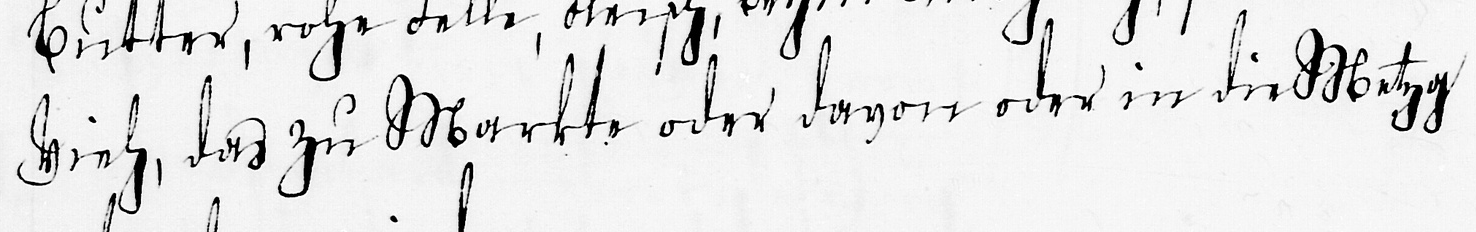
Vieh, das zu Markte oder davon oder in die Metzg
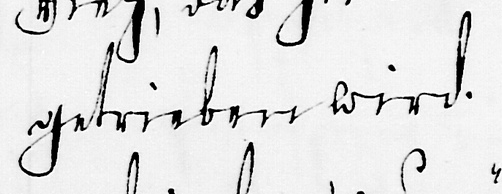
getrieben wird.
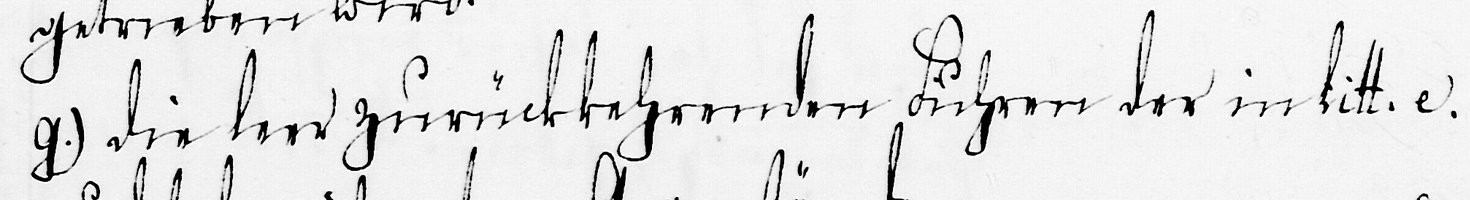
g.) Die leer zurückkehrenden Fuhren der in litt.
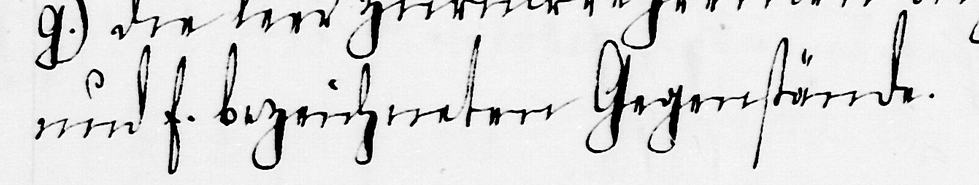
und f. bezeichneten Gegenstände.
